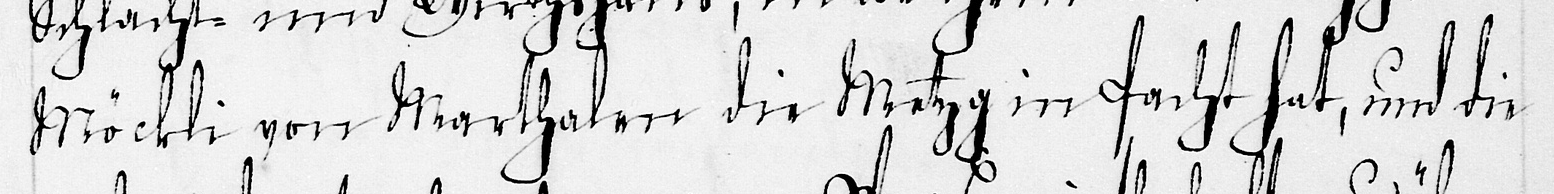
Möckli von Marthalen die Metzg in Pacht hat, und die
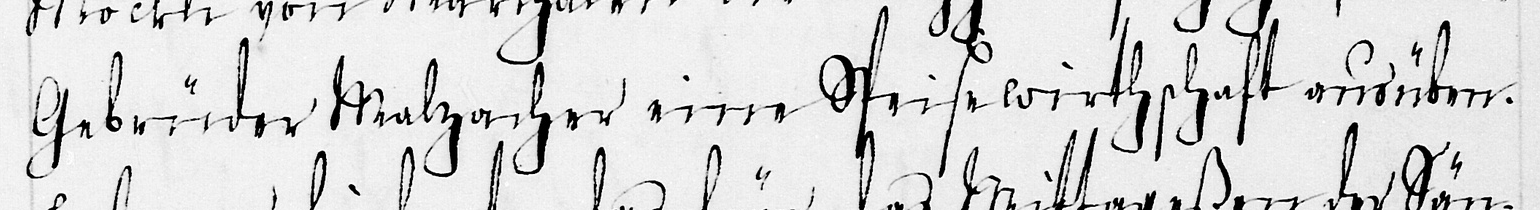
Gebrüder Malzacher eine Speisewirthschaft ausüben.
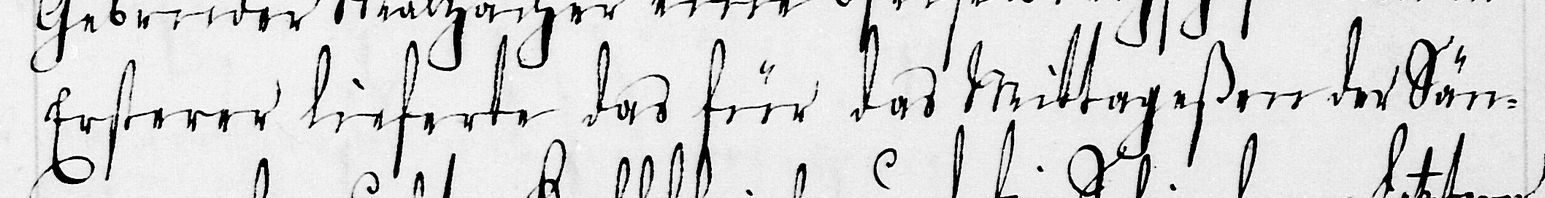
Erstere lieferte das für das Mittageßen der Sän¬
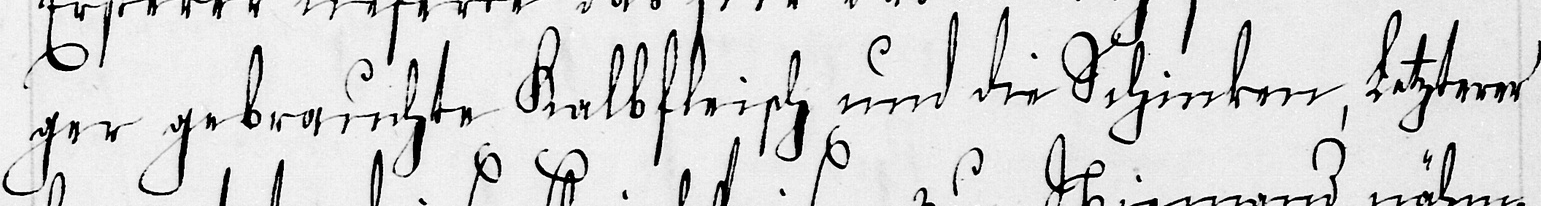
ger gebrauchte Kalbfleisch und die Schinken, Letzter¬
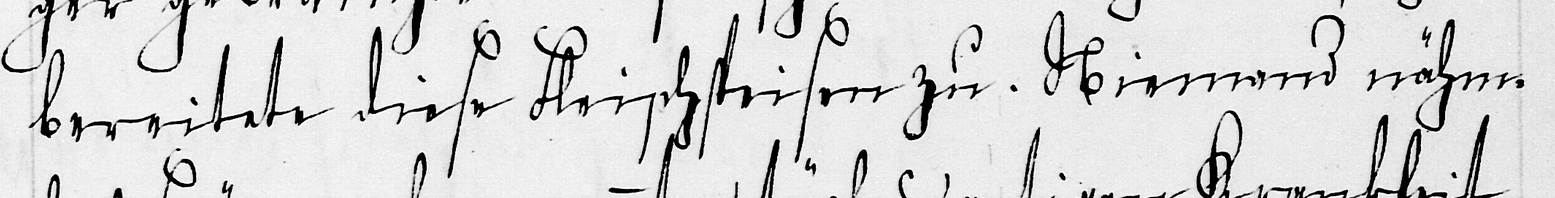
bereitete diese Fleischspeisen zu. Niemand nähm¬
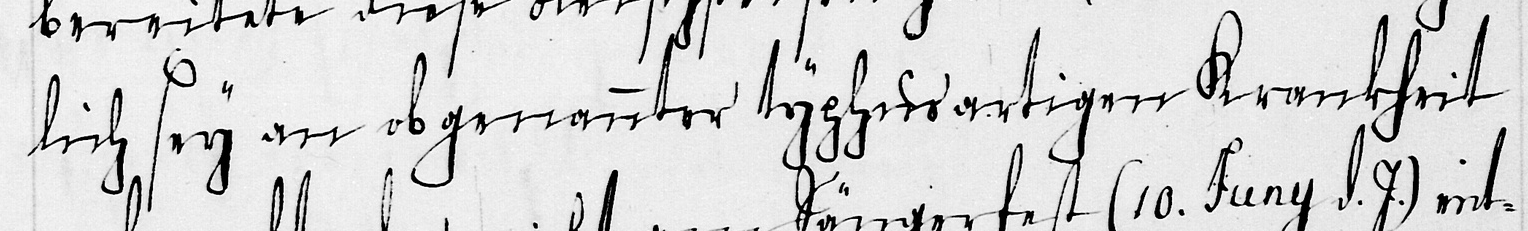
lich sey an obgenannter typhusartigen Krankheit
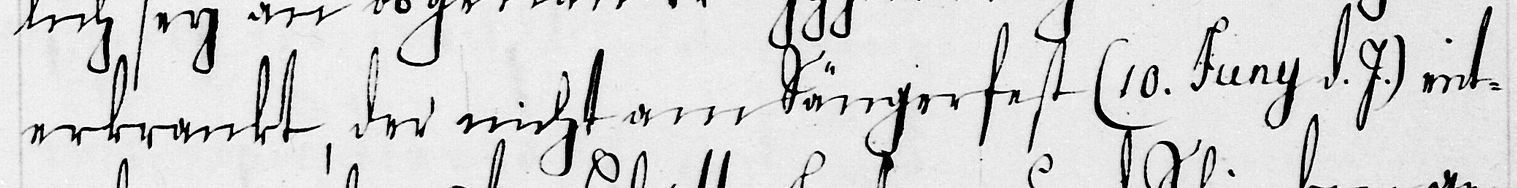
erkrankt, der nicht am Sängerfest (10. Juny d. J.) ent¬
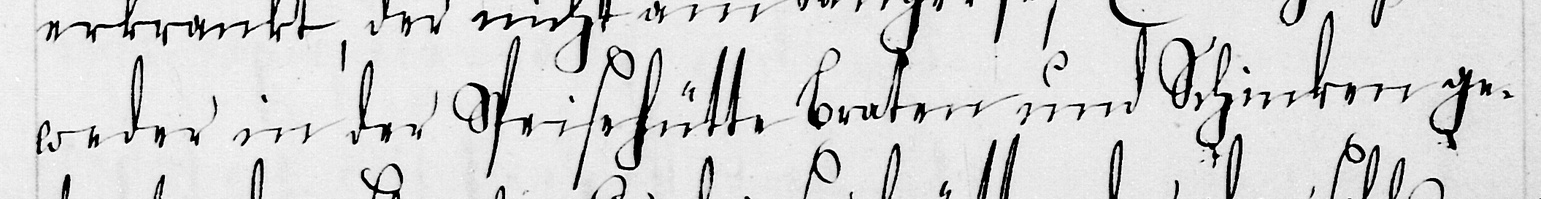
weder in der Speisehütte Braten und Schinken ge¬
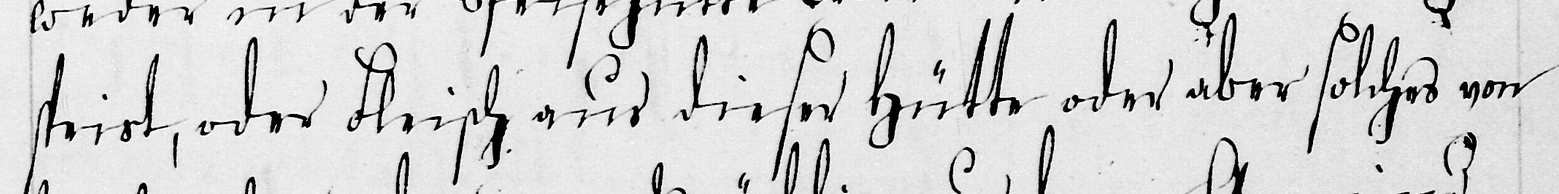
speist, oder Fleisch aus dieser Hütte oder aber solches von
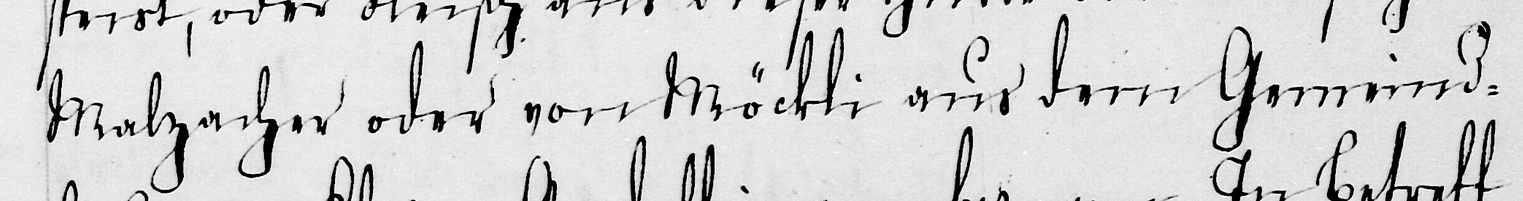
Malzacher oder von Möckli aus dem Gemeind¬
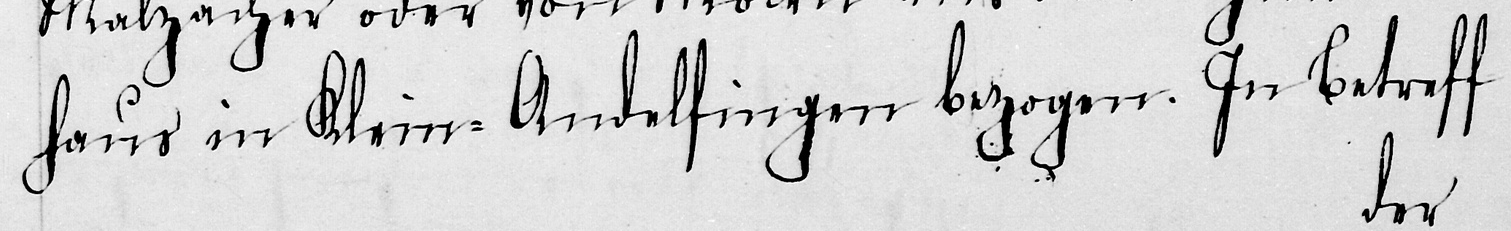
haus in Klein-Andelfingen bezogen. In Betreff
